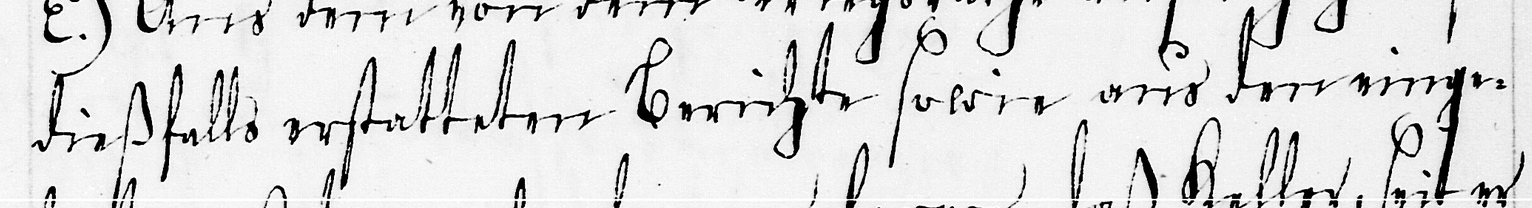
dießfalls erstatteten Berichte sowie aus den einge¬
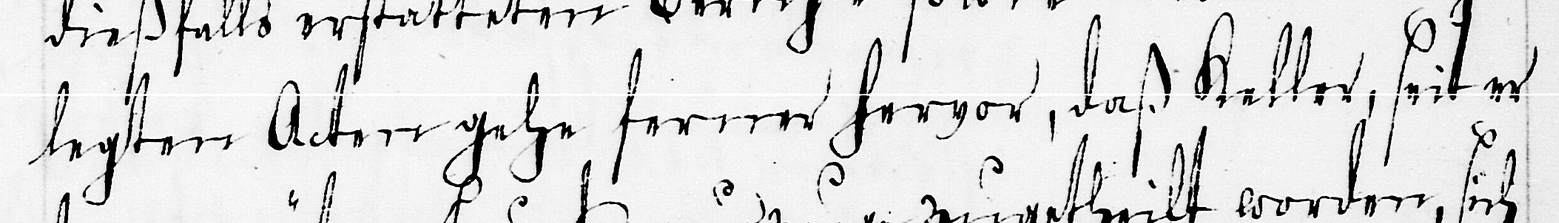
legten Acten gehe ferner hervor, daß Keller, seit er
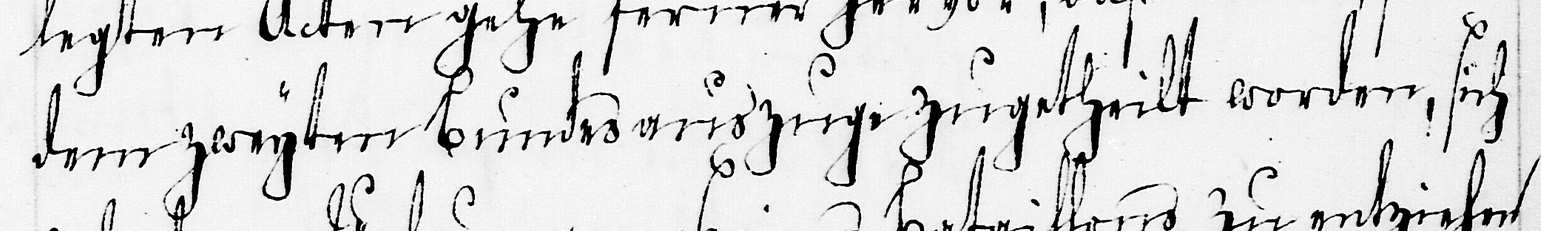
dem zweyten Bundesauszuge zugetheilt worden, sich
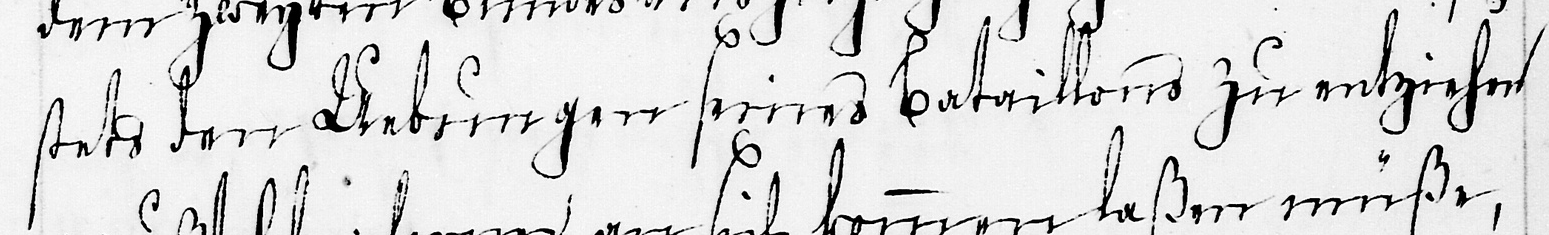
stets den Uebungen seines Bataillons zu entziehen
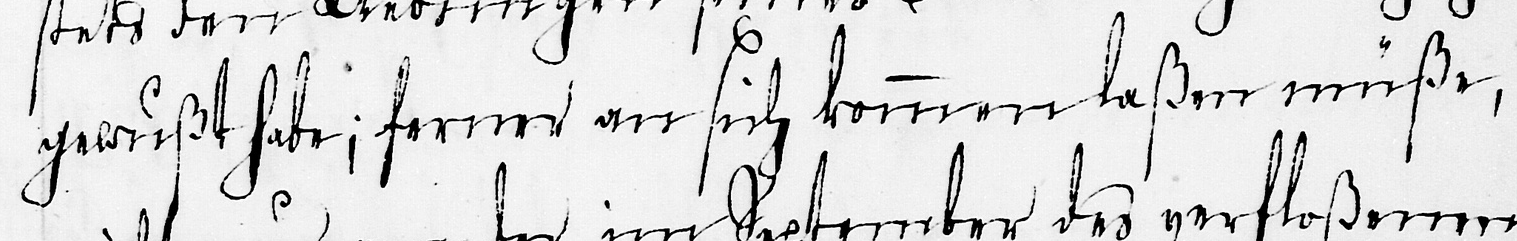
gewußt habe; ferner an sich kommen laßen müße,
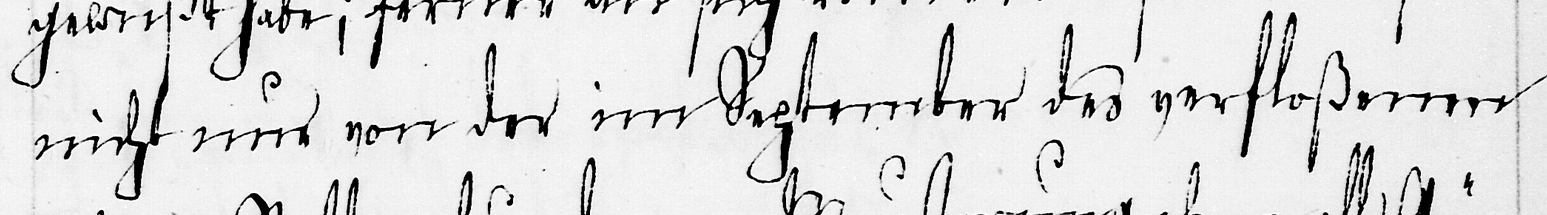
nicht nur von der im September des verfloßenen
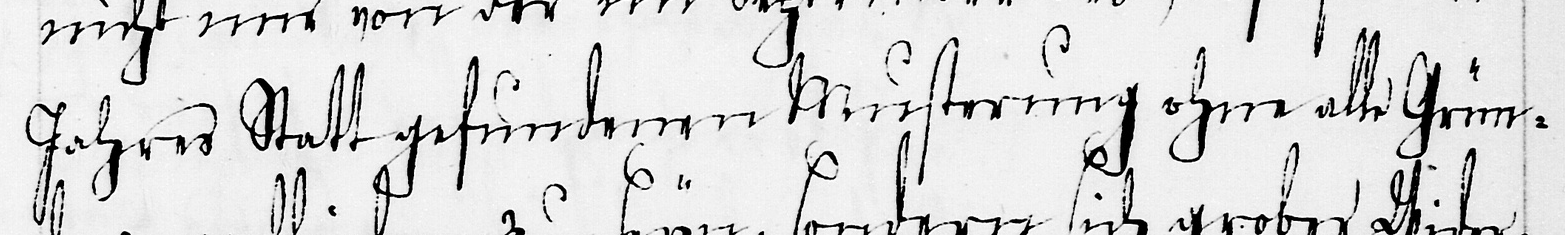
Jahres Statt gefundenen Musterung ohne alle Grün¬
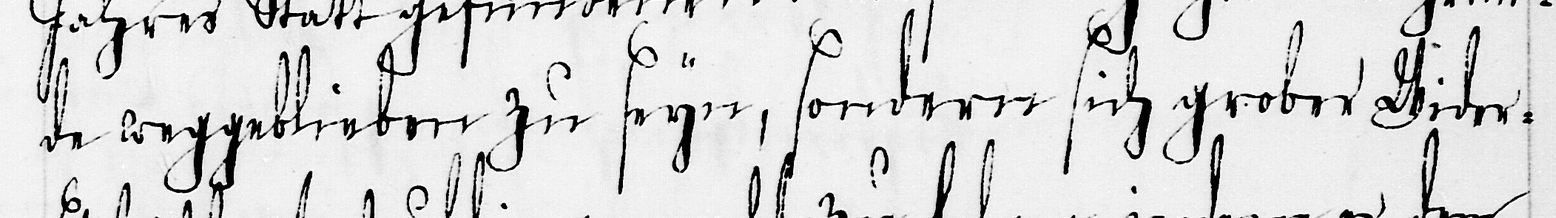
de weggeblieben zu seyn, sondern sich grober Widers¬
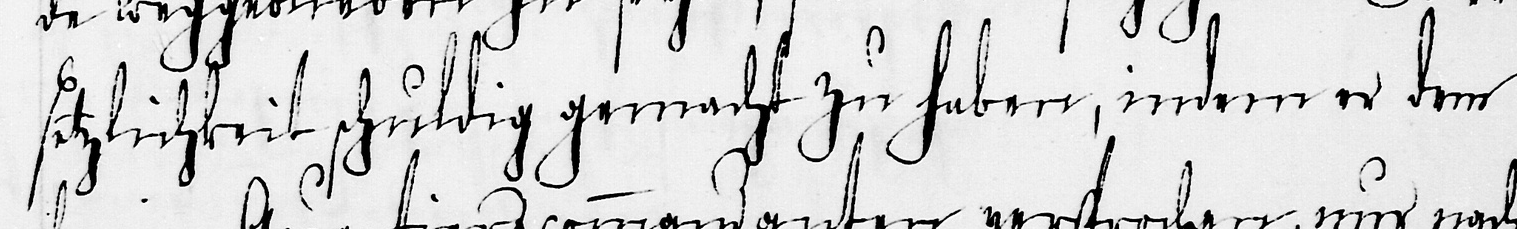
etzlichkeit schuldig gemacht zu haben, indem er dem
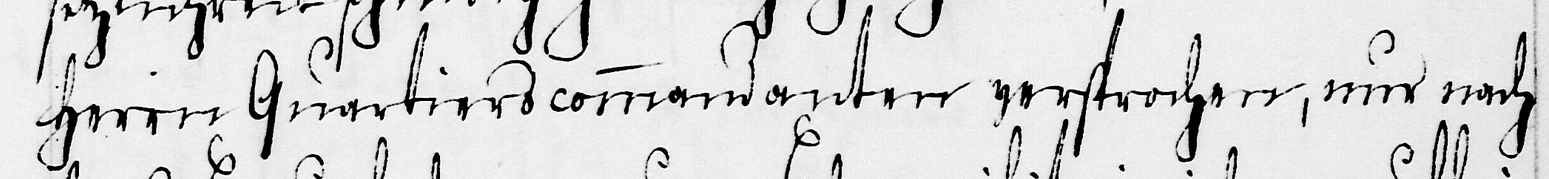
Herrn Quartierscommandanten versprochen, nur nach
